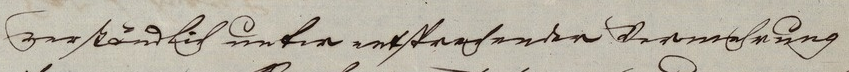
verständlich unter entsprechender Vermehrung
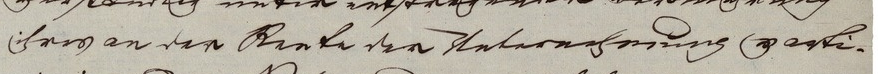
ihres an der Rente der Unternehmung parti-
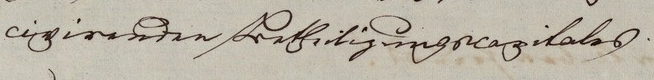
cipirenden Betheiligungscapitales.
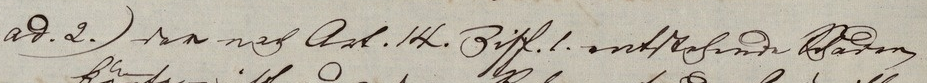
ad. 2.) Der nach Art. 14. Ziff. 1. entstehende Schaden
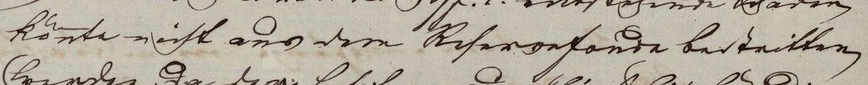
könnte nicht aus dem Reservefonds bestritten
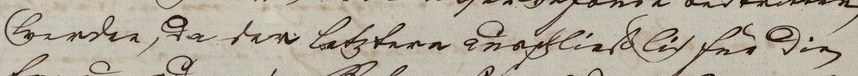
werden, da der letztere ausschließlich für die
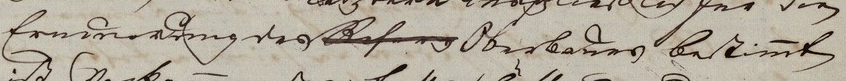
Erneuerung des Reserv Oberbaues bestimmt
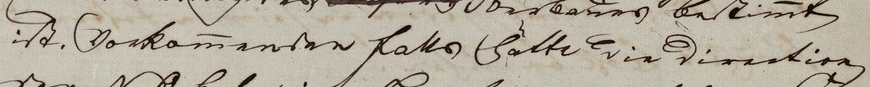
ist. Vorkommenden Falls hätte die Direction
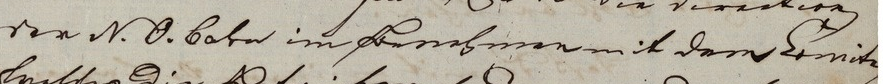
der N.O.bahn im Benehmen mit dem Comite,
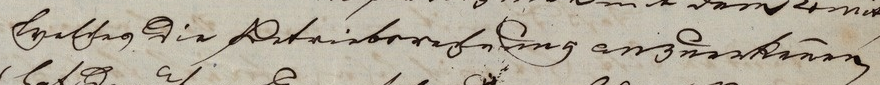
welches die Betriebsrechnung anzuerkennen
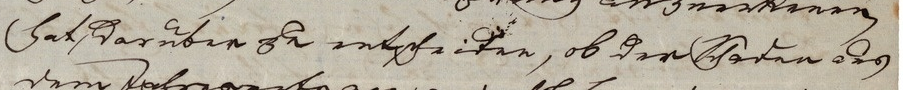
hat, darüber zu entscheiden, ob der Schaden aus
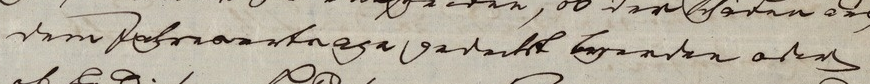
dem Jahresertrage gedeckt werden oder
